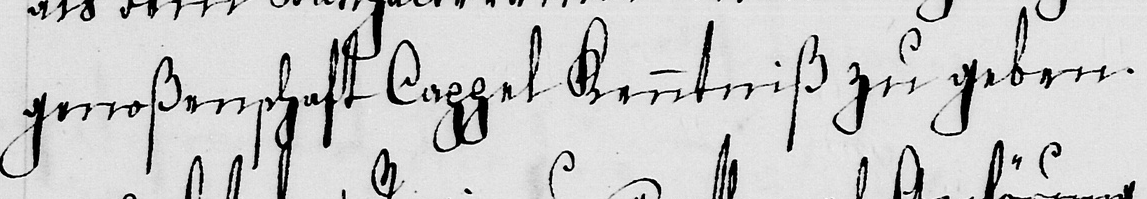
genoßenschaft Cappel Kenntniß zu geben.
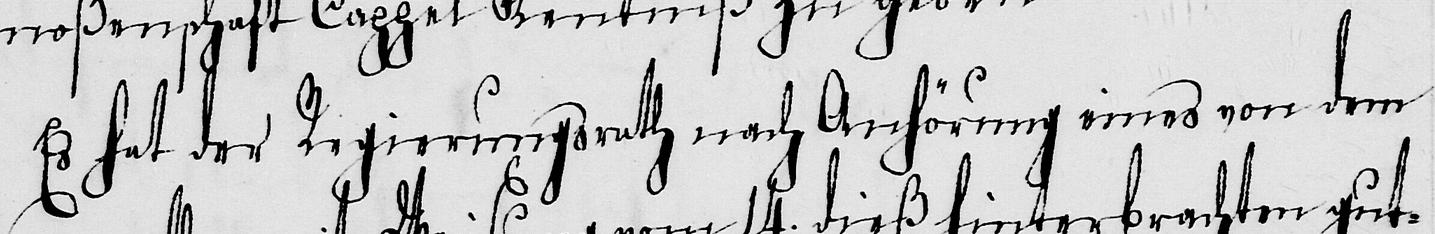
Es hat der Regierungsrath nach Anhörung eines von dem
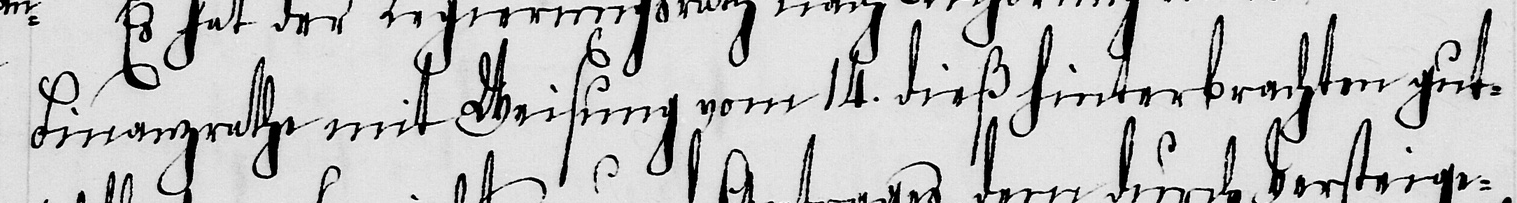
Finanzrathe mit Weisung vom 14. dieß hinterbrachten gut¬
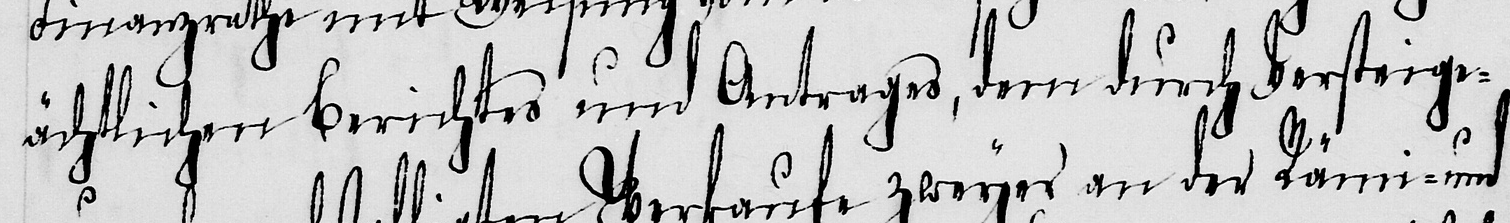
ächtlichen Berichtes und Antrages, dem durch Versteige¬
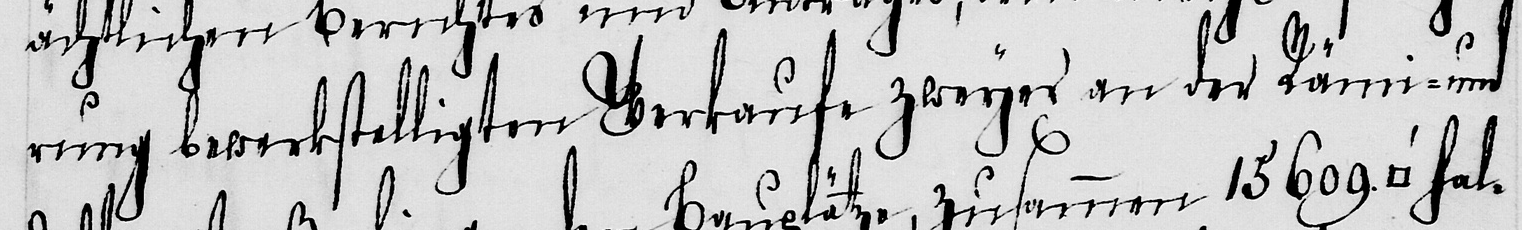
rung bewerkstelligten Verkaufe zweyer an der Rämi- und
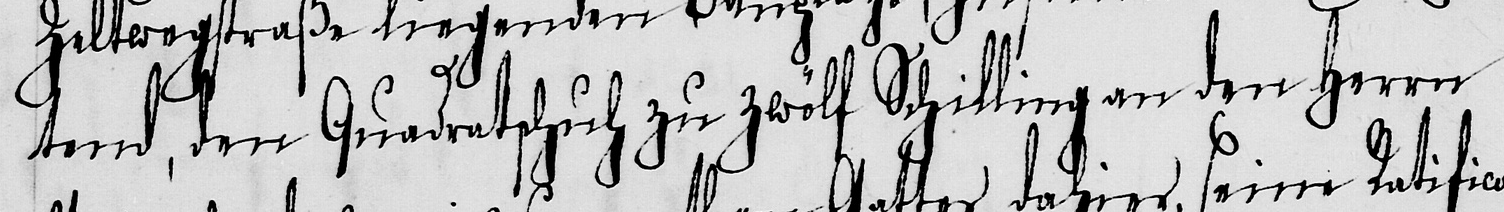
tend, den Quadratschuh zu zwölf Schilling an den Herrn
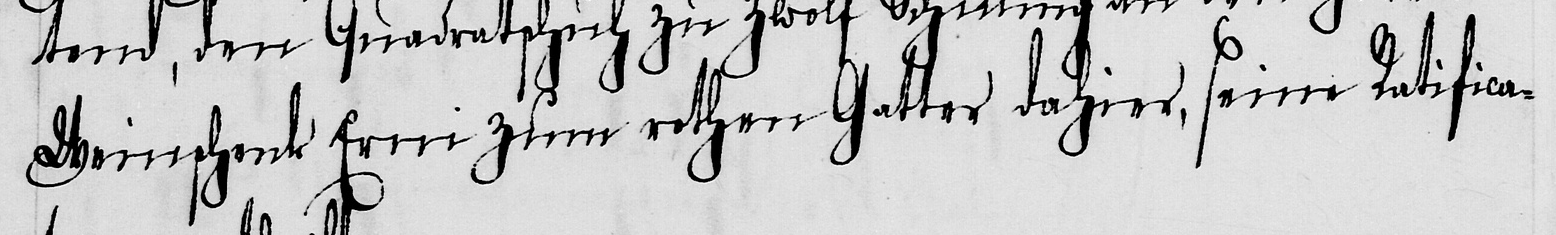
Weinschenk Erni zum rothen Gatter dahier, seine Ratifica¬
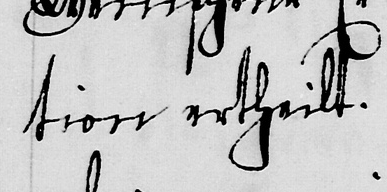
tion ertheilt.
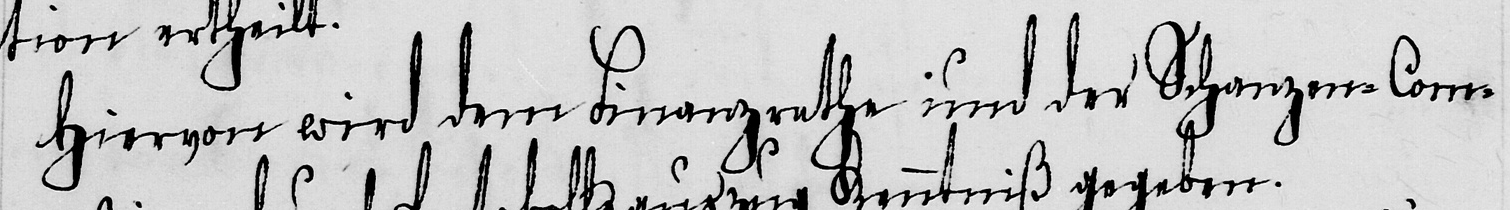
Hiervon wird dem Finanzrathe und der Schanzen-Com¬
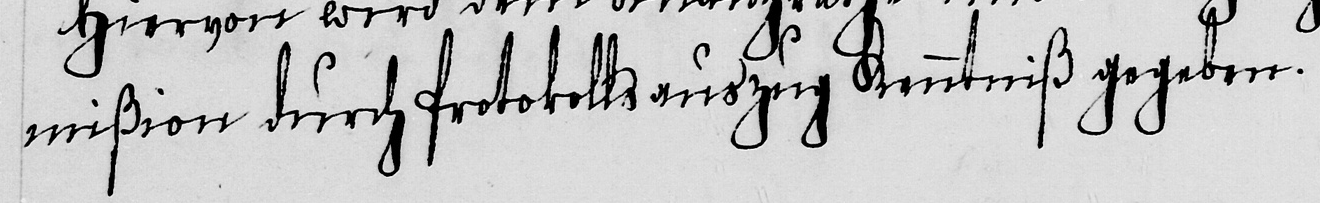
mißion durch Protokollsauszug Kenntniß gegeben.
